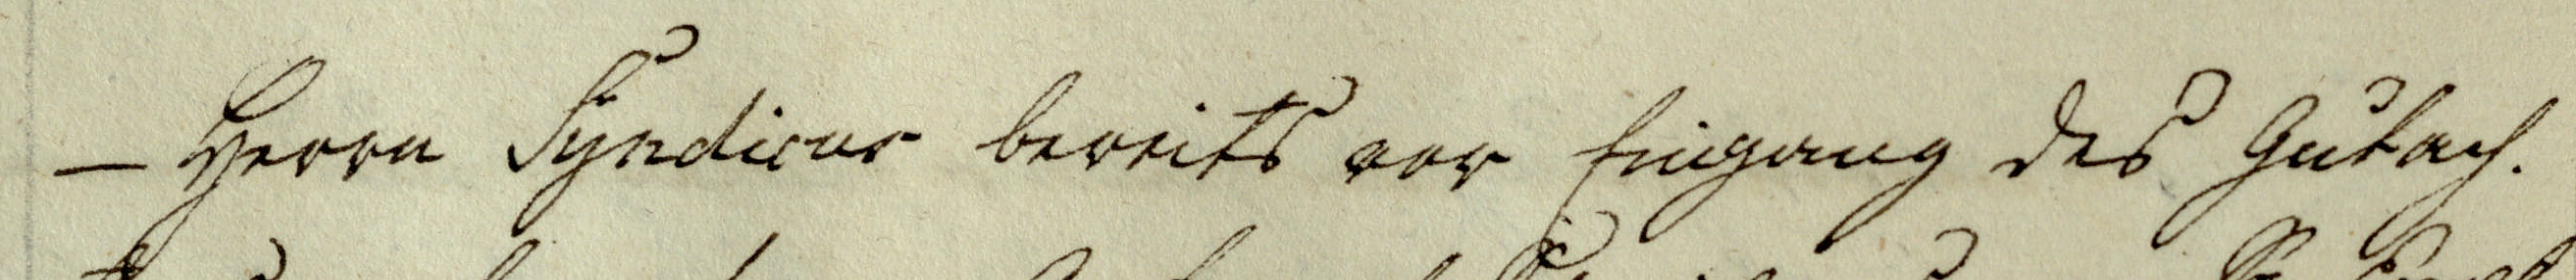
Herrn Sÿndicus bereits vor Eingang des Gutach¬
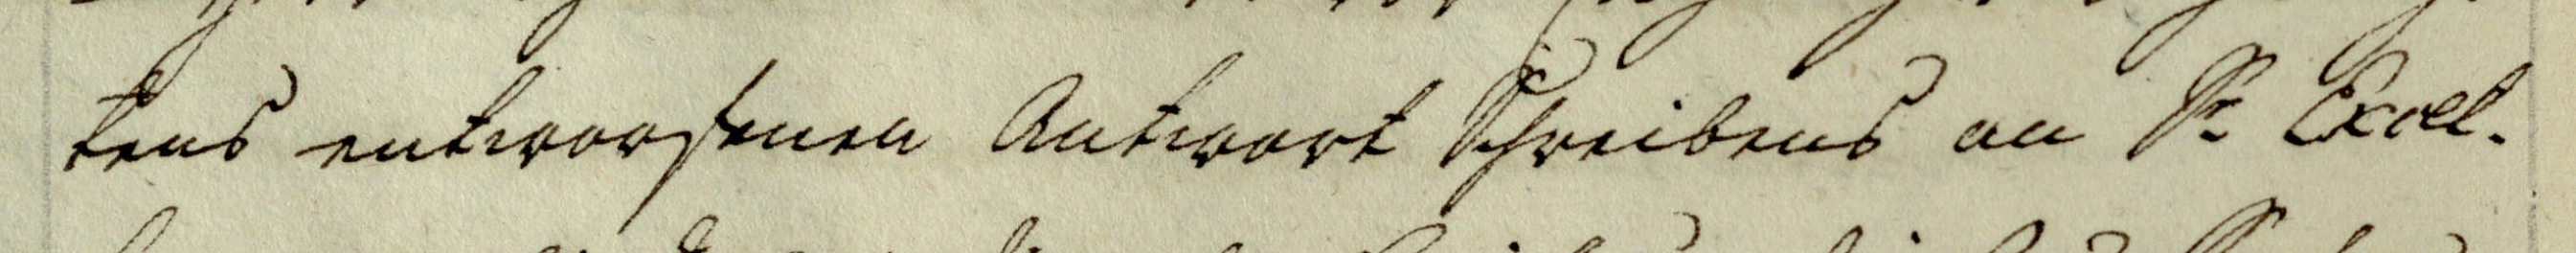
tens entworfenen Antwort Schreibens an Sr Excel¬
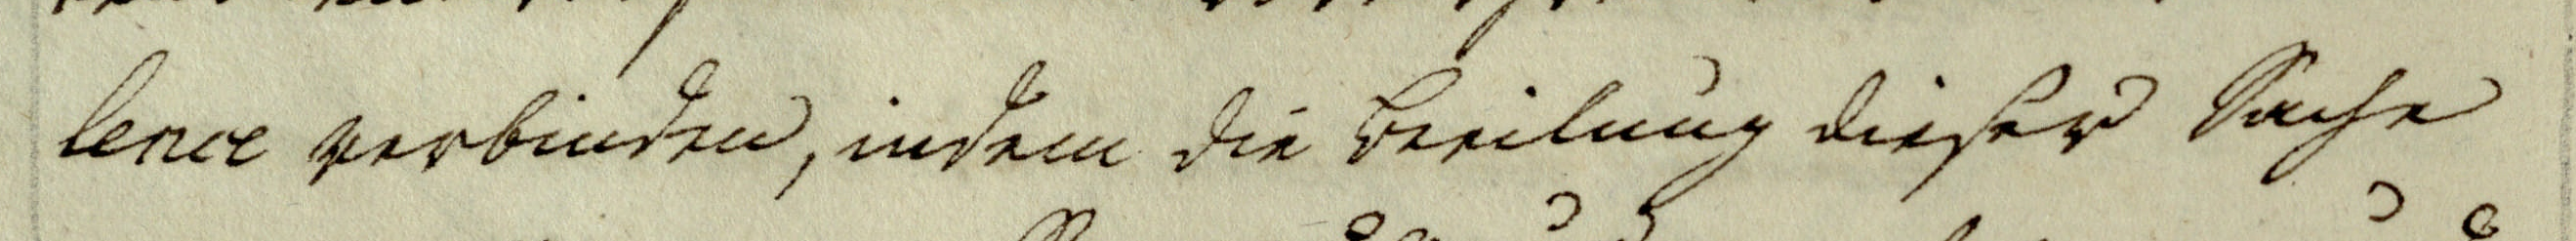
lence verbinden, indem die Beeilung dieser Sache
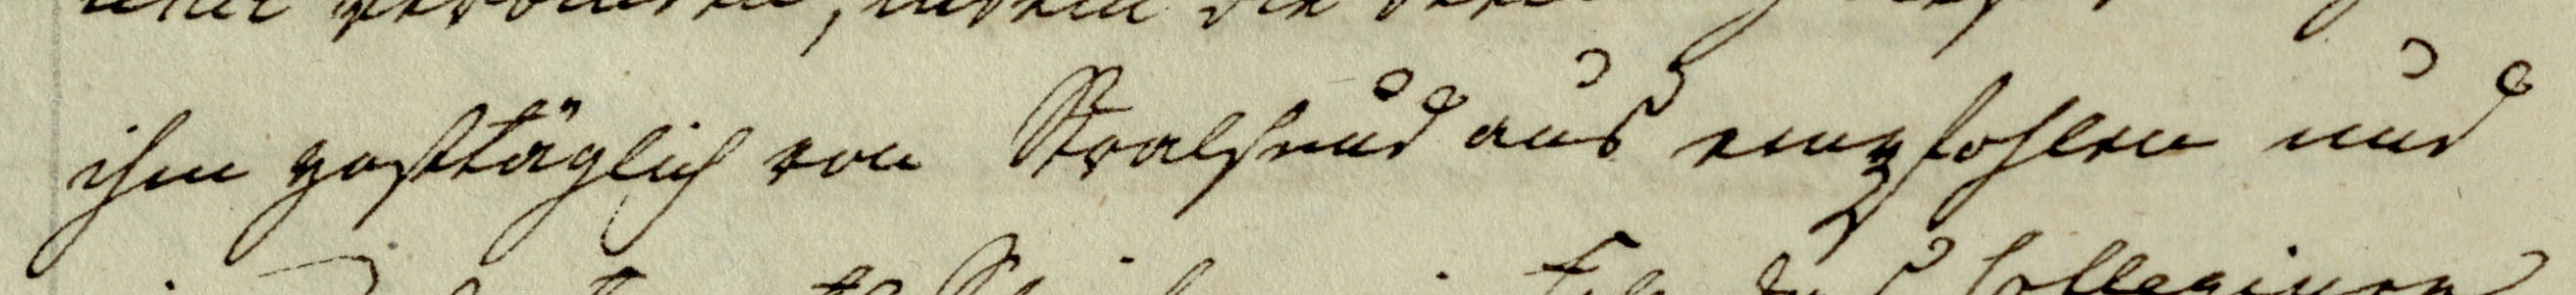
ihm posttäglich von Stralsund aus empfohlen und
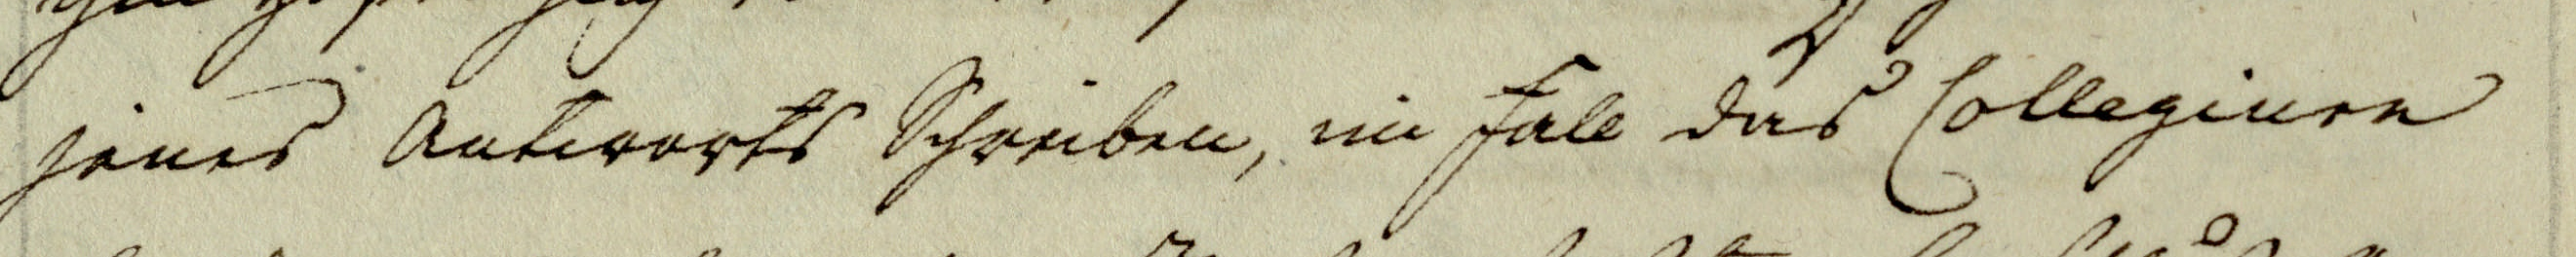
jenes Antworts Schreiben, im Fall das Collegium
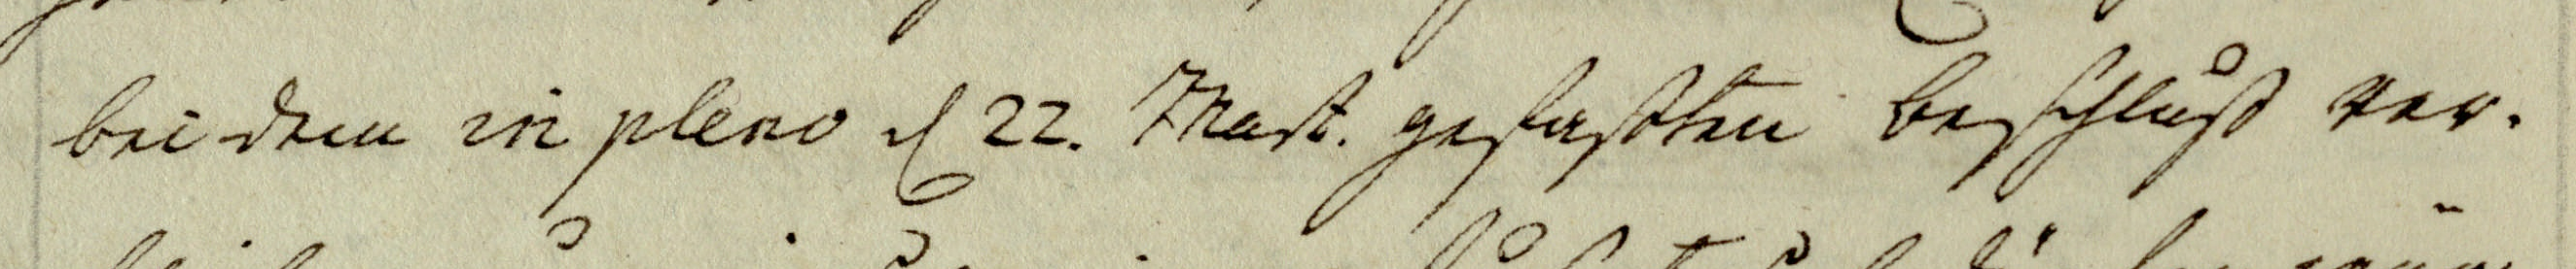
bei dem in pleno d. 22. Mart. gefaßten Beschluß ver¬
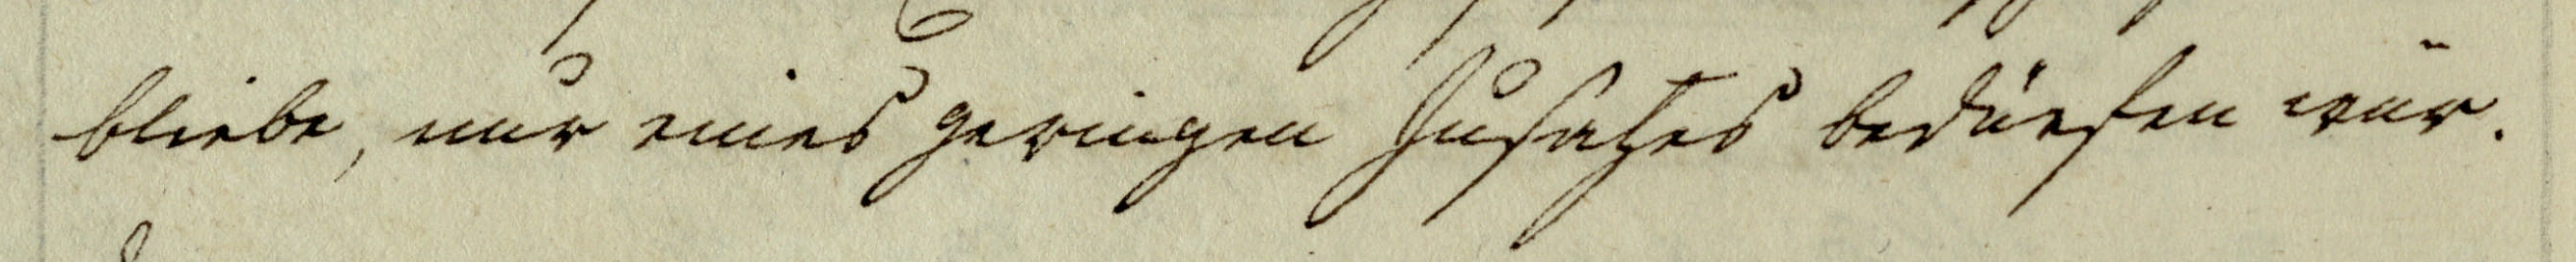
bliebe, nur eines geringen Zusatzes bedürfen wür¬
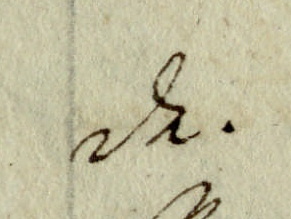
de.
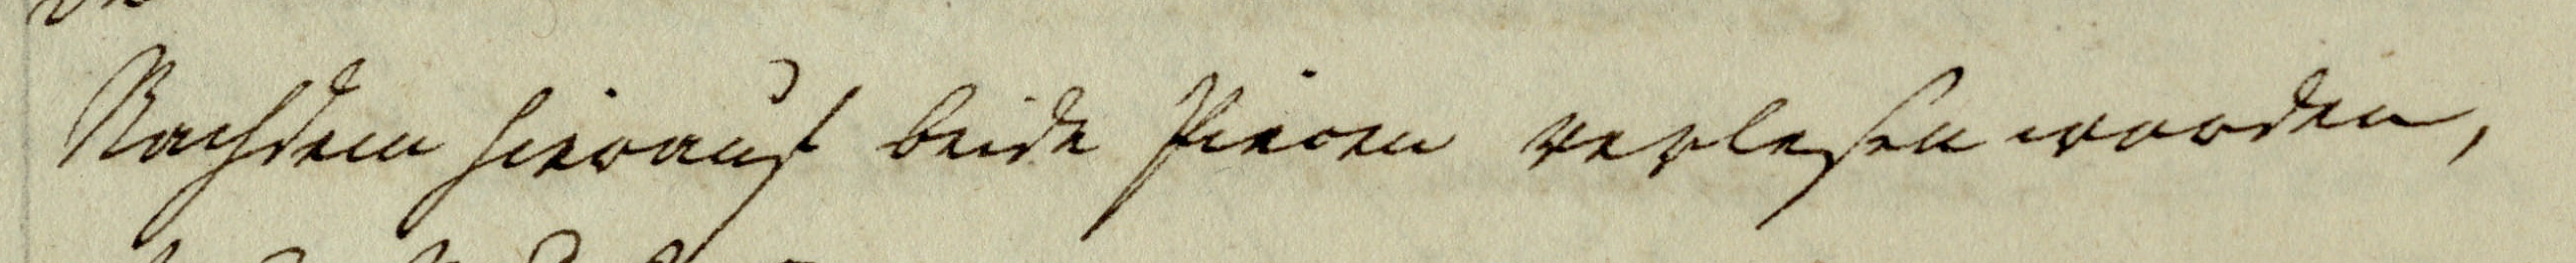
Nachdem hierauf beide Piecen verlesen worden,
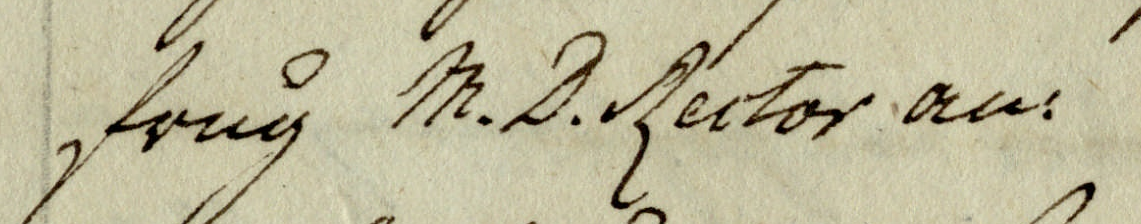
frug M. D. Rector an:
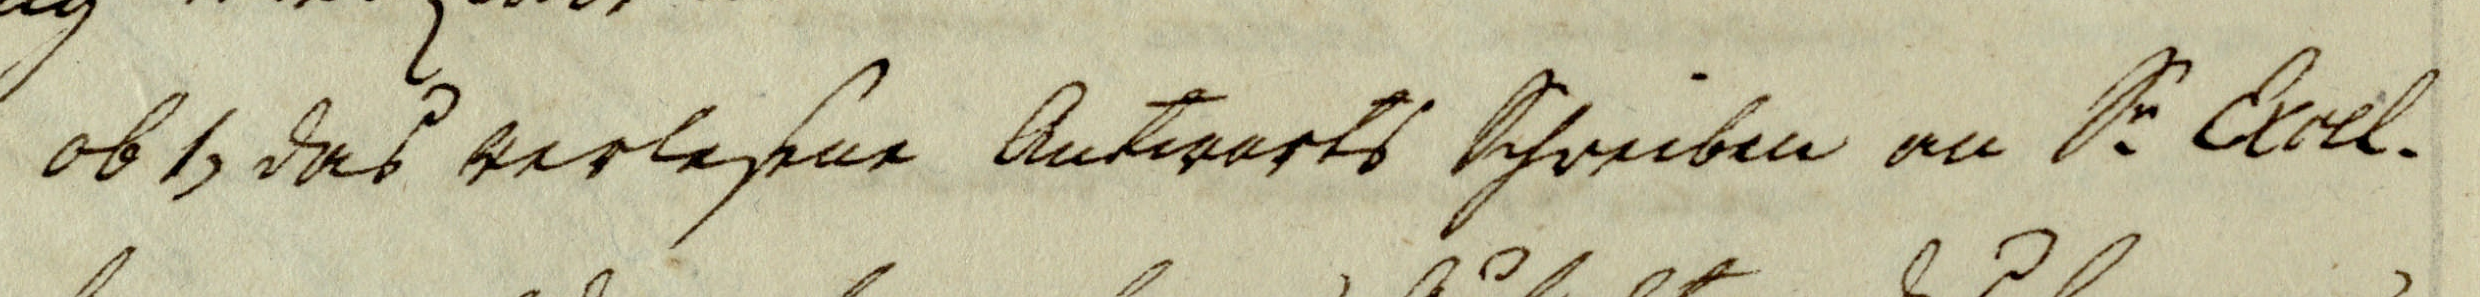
ob 1., das verlesene Antworts Schreiben an Sr Excel¬
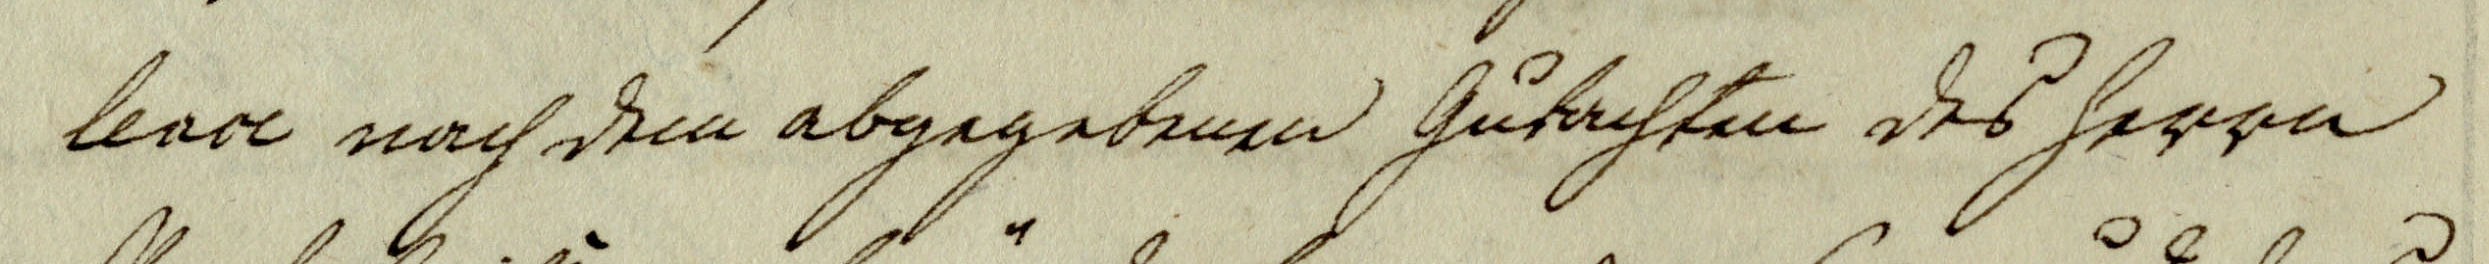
lence nach dem abgegebenen Gutachten des Herrn
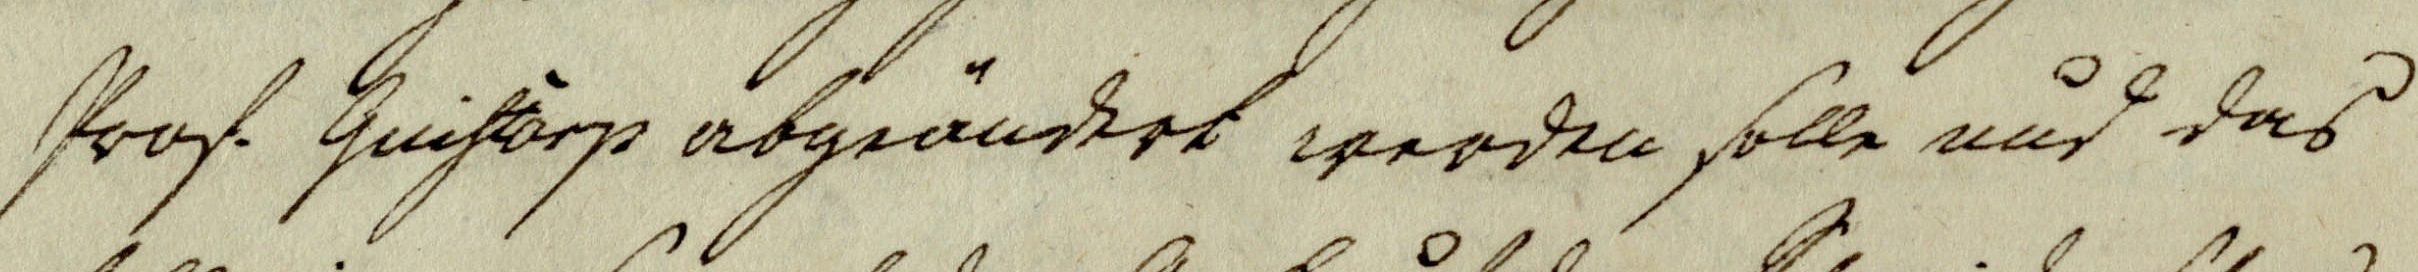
Prof. Quistorp abgeändert werden solle und das
